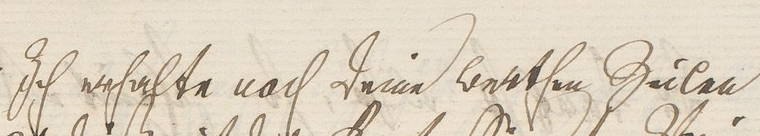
Ich erhalte noch Deine werthen Zeilen
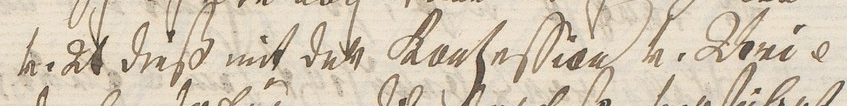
v. 21. dieß mit der Konzession v. Uri &
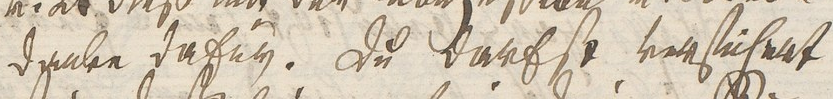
danke dafür. Du darfst versichert
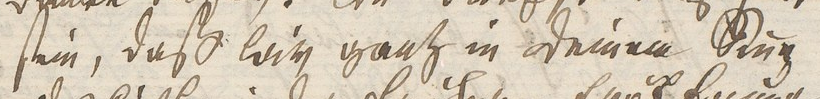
sein, daß wir ganz in Deinem Sinne
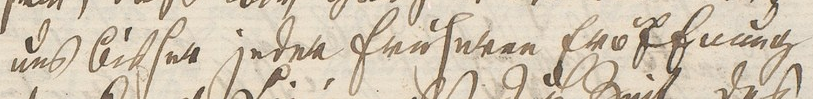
uns bisher jeder früheren Eröffnung
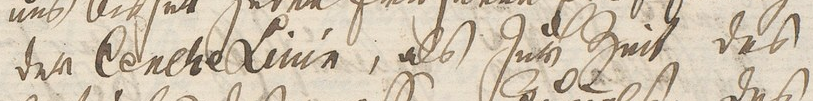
der Cenere Linie, als zur Zeit des
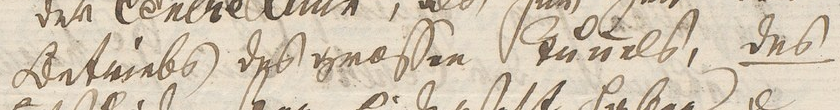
Betriebs des großen Tunnels, des
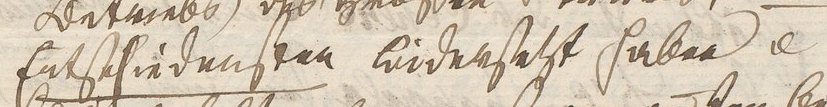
Entschiedensten widersezt haben &
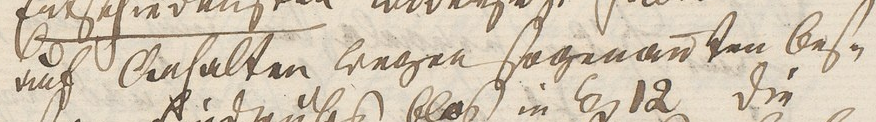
auf Anhalten wegen sogenannten bes-
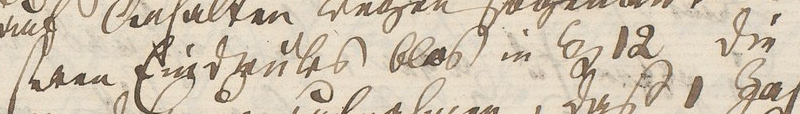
seren Eindruks blos in § 12 die
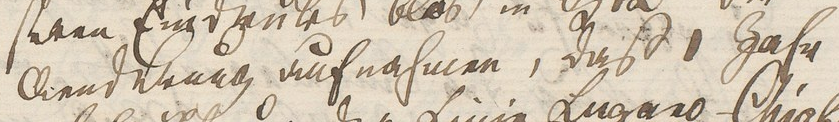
Aenderung aufnahmen, daß 1 Jahr
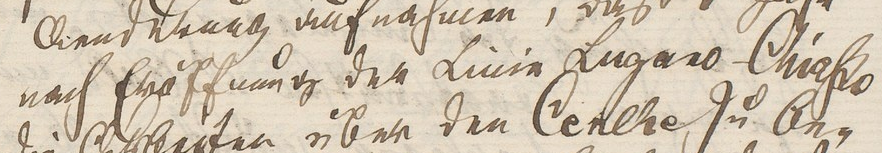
nach Eröffnung der Linie Lugano – Chiasso
